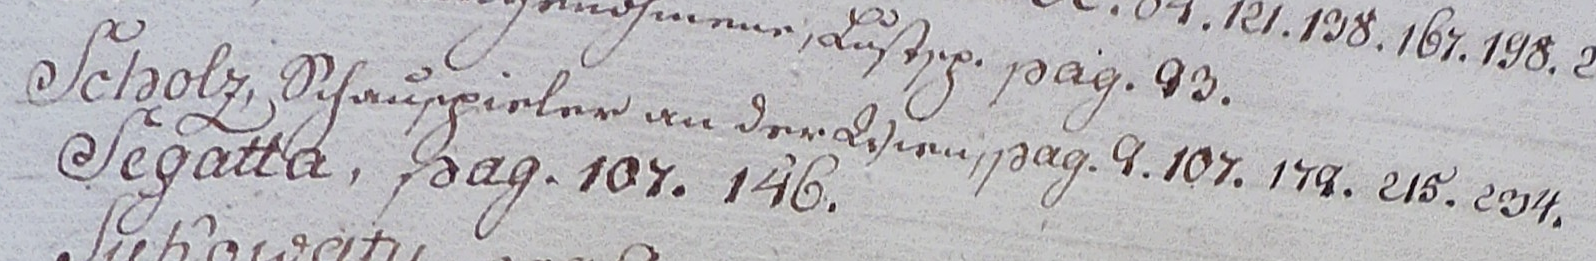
Scholz, Schauspieler an der Wien, pag. 9. 107. 179. 215. 234.
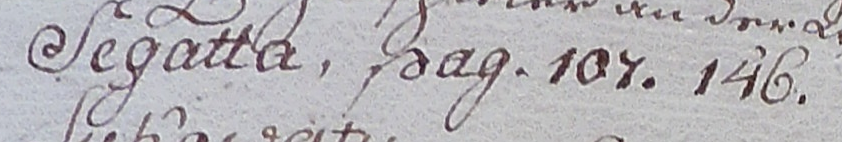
Segatta, pag. 107. 146.
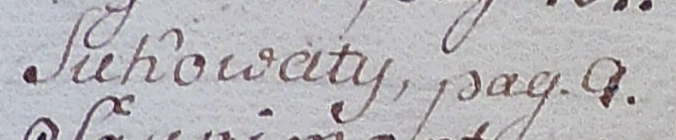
Sukowaty, pag. 9.
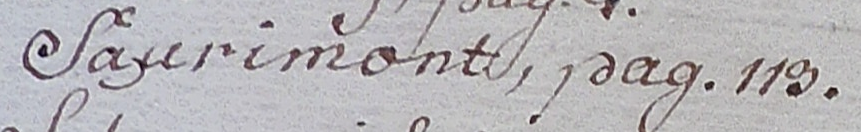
Saurimont, pag. 113.
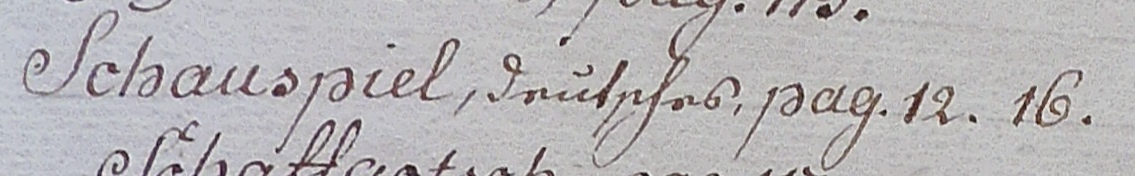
Schauspiel, deutsches, pag. 12. 16.
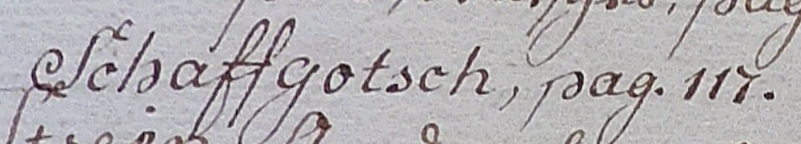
Schaffgotsch, pag. 117.
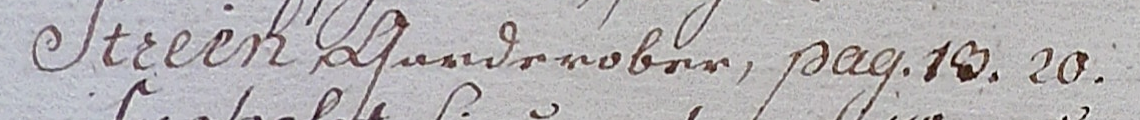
Streen, Garderober, pag. 13. 20.
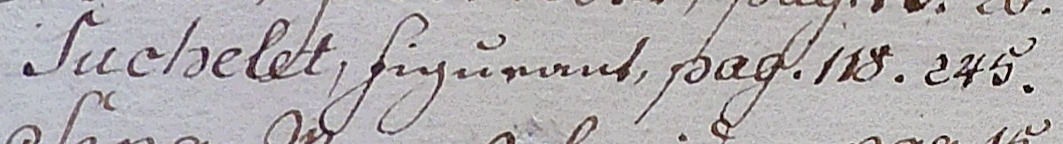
Suchelet, Figurant, pag. 118. 245.
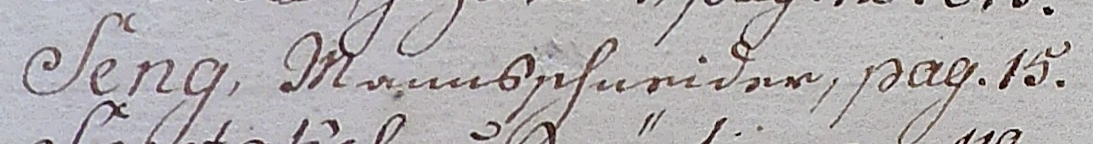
Seng, Mannsschneider, pag. 15.
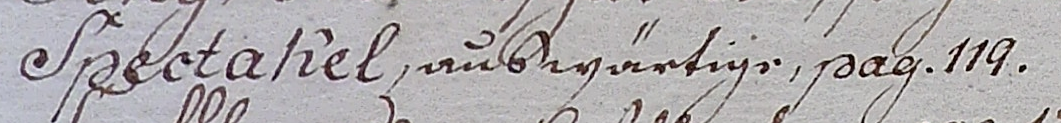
Spectakel, auswärtige, pag. 119.
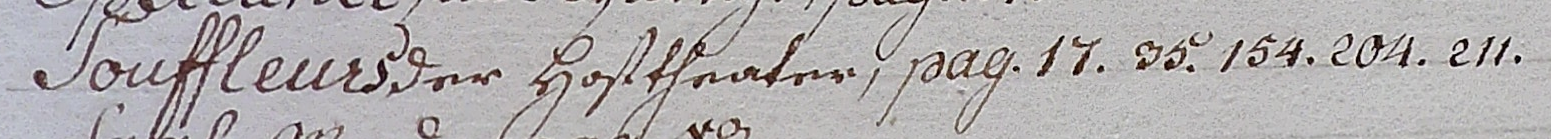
Souffleurs der Hoftheater, pag. 17. 35. 154. 204. 211.
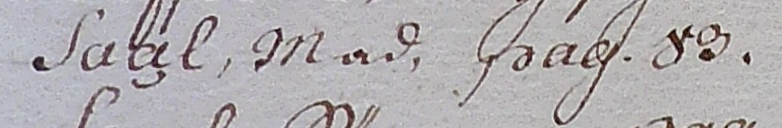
Saal, Mad, pag. 83.
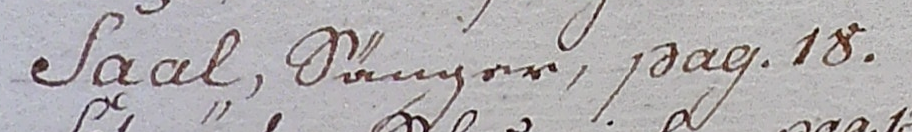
Saal, Sänger, pag. 18.
